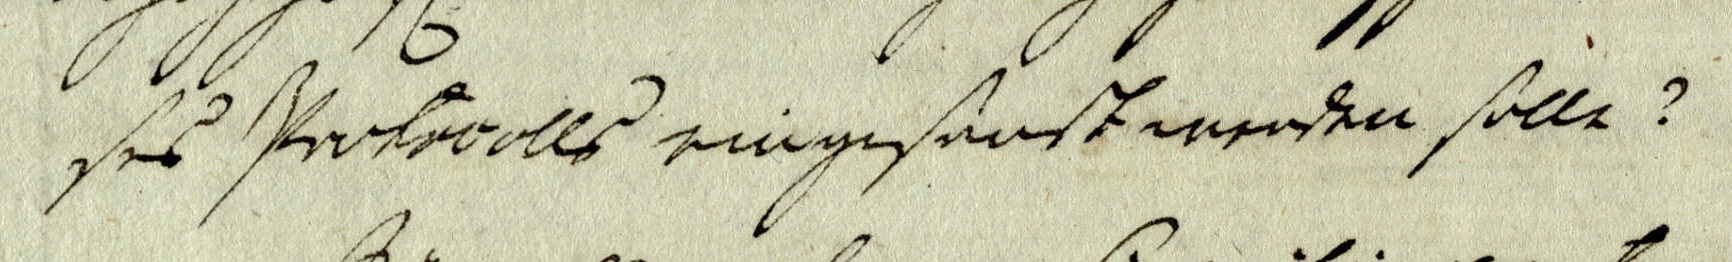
ses Protocolls eingesandt werden solle?
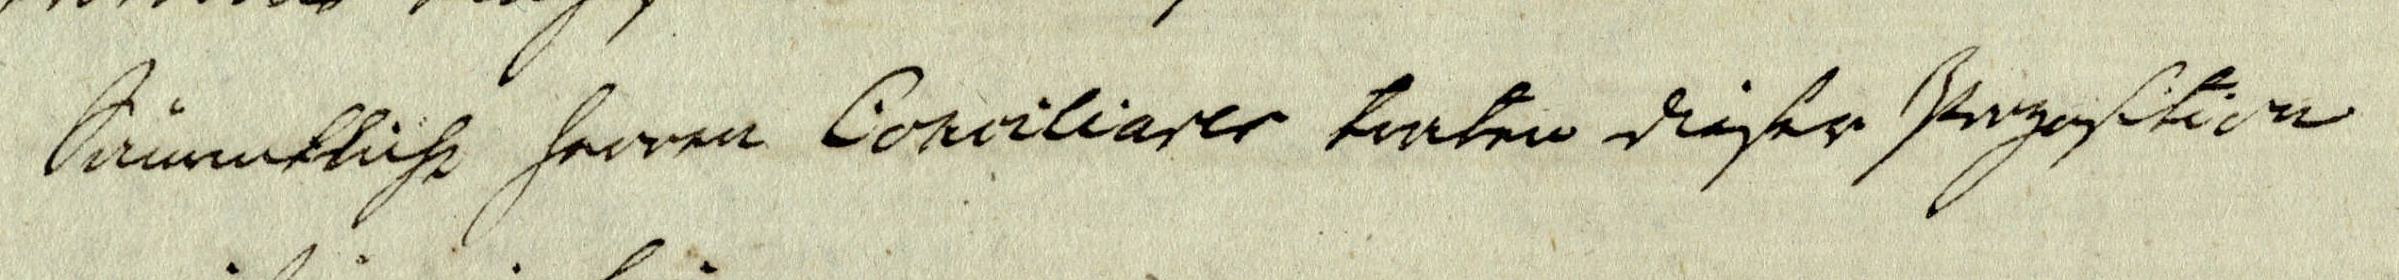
Sämmtliche Herren Conciliares traten dieser Proposition
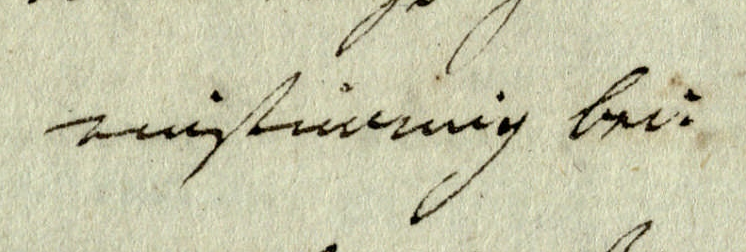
einstimmig bei.
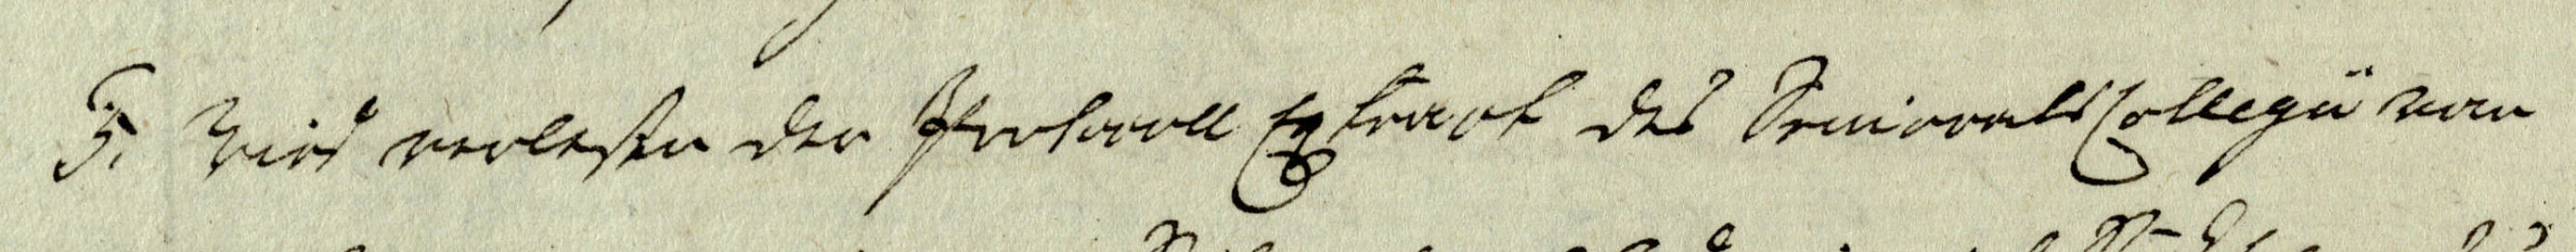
5., Wird verlesen der Protocoll Extract des SenioratsCollegii vom
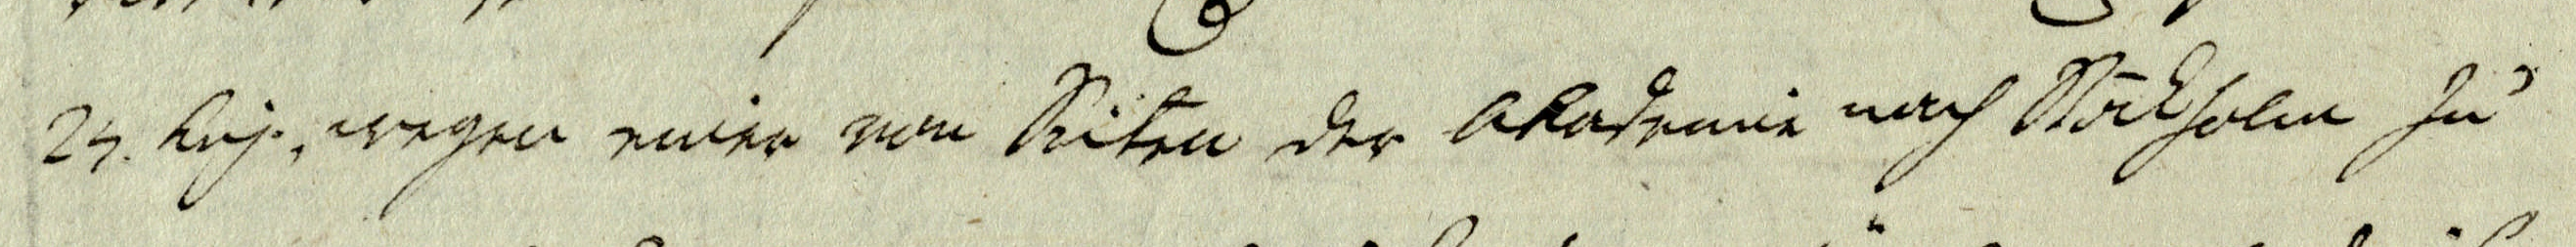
24. huj, wegen einer von Seiten der Akademie nach Stockholm zu
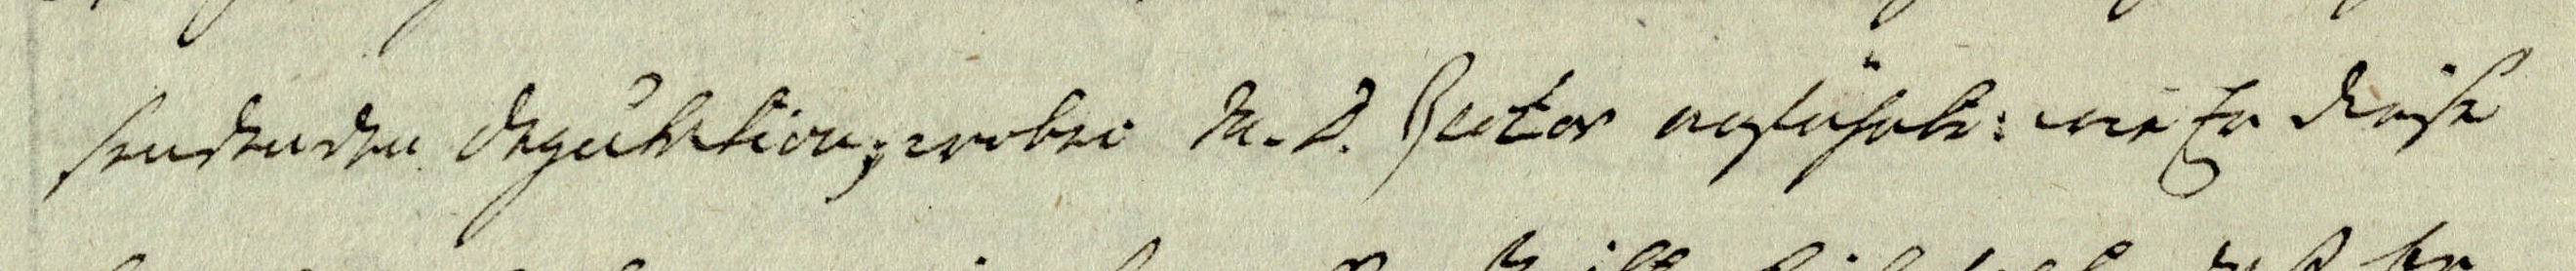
sendenden Deputation, wobei M. D. Rector anführte: wie Er diese
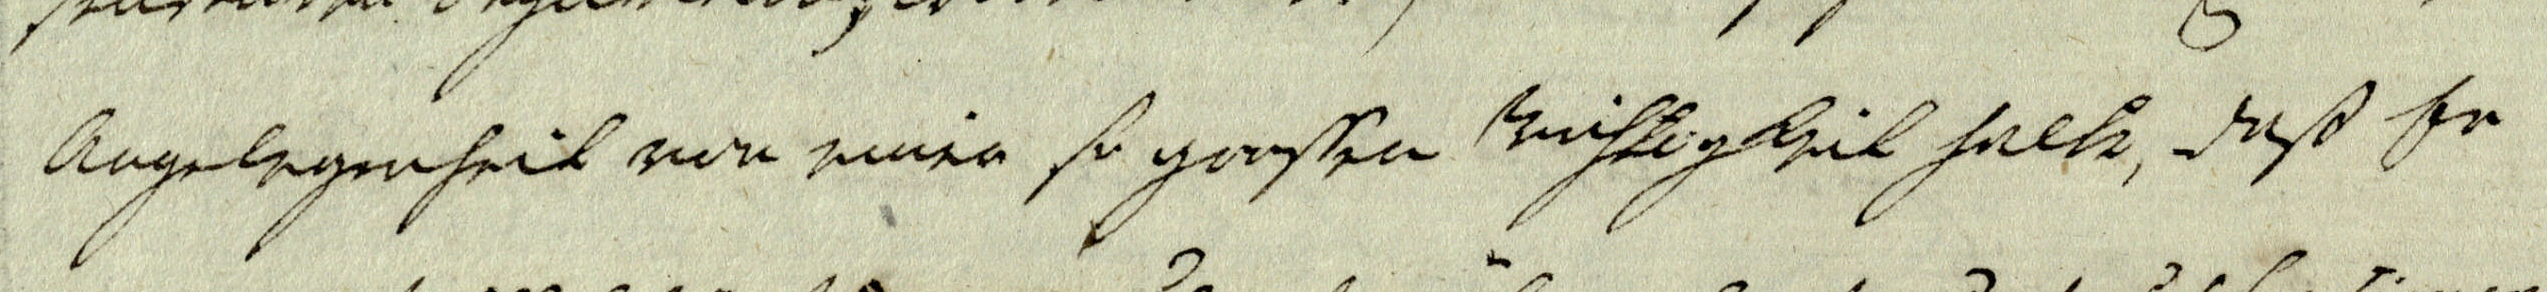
Angelegenheit von einer so grossen Wichtigkeit halte, daß Er
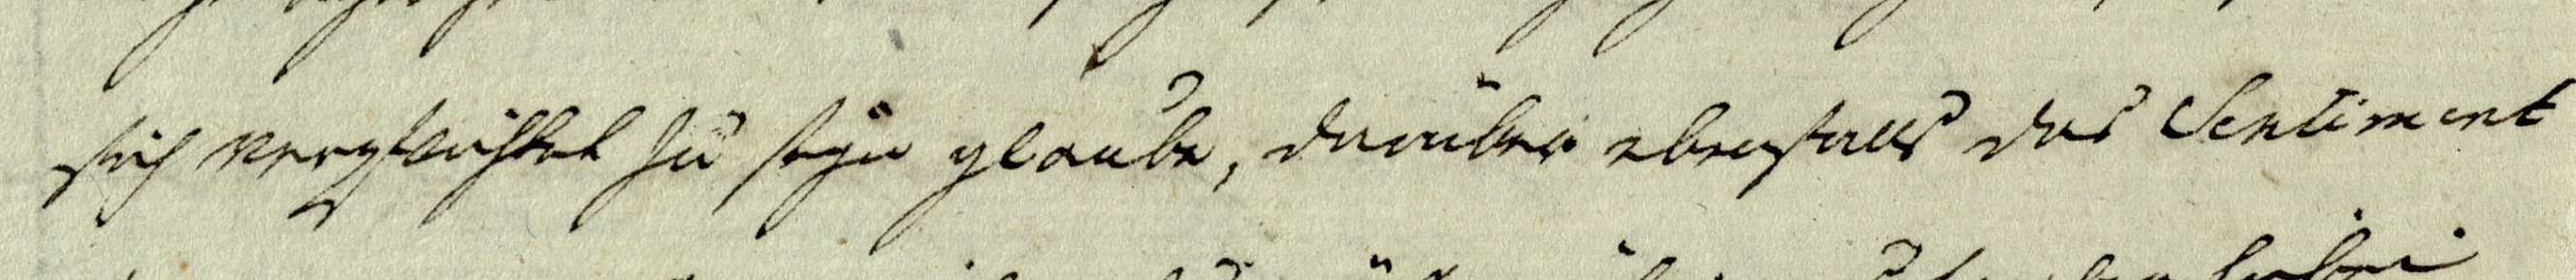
sich verpflichtet zu seÿn glaube, darüber ebenfalls das Sentiment
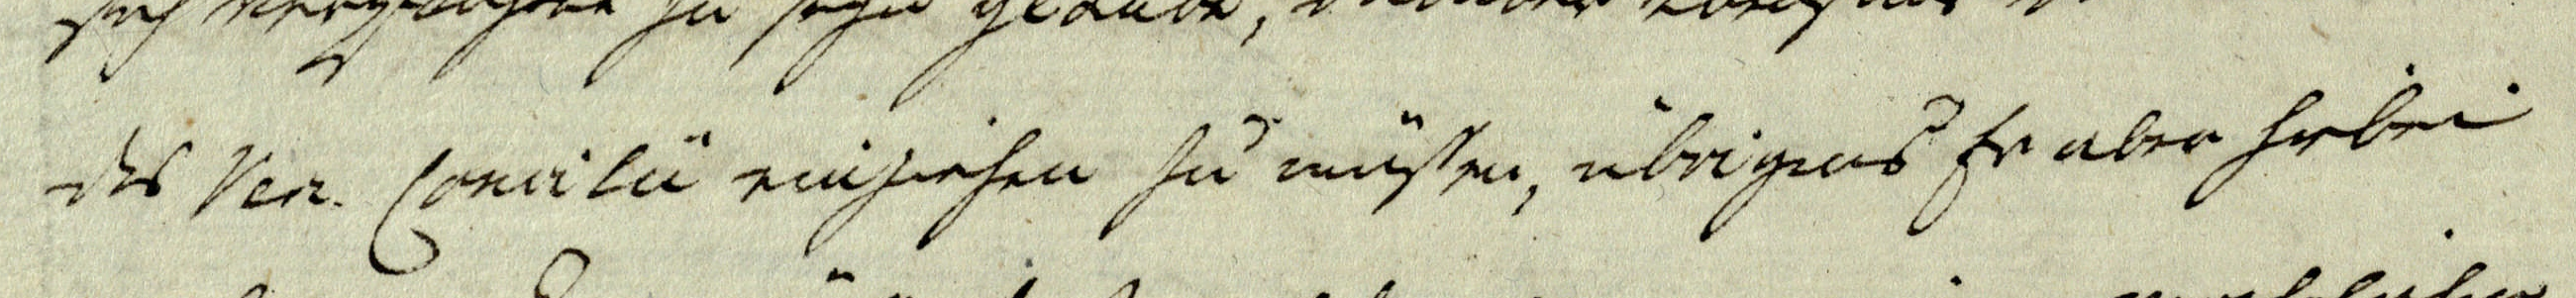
des Ven. Concilii einziehen zu müssen, übrigens Er aber hiebei
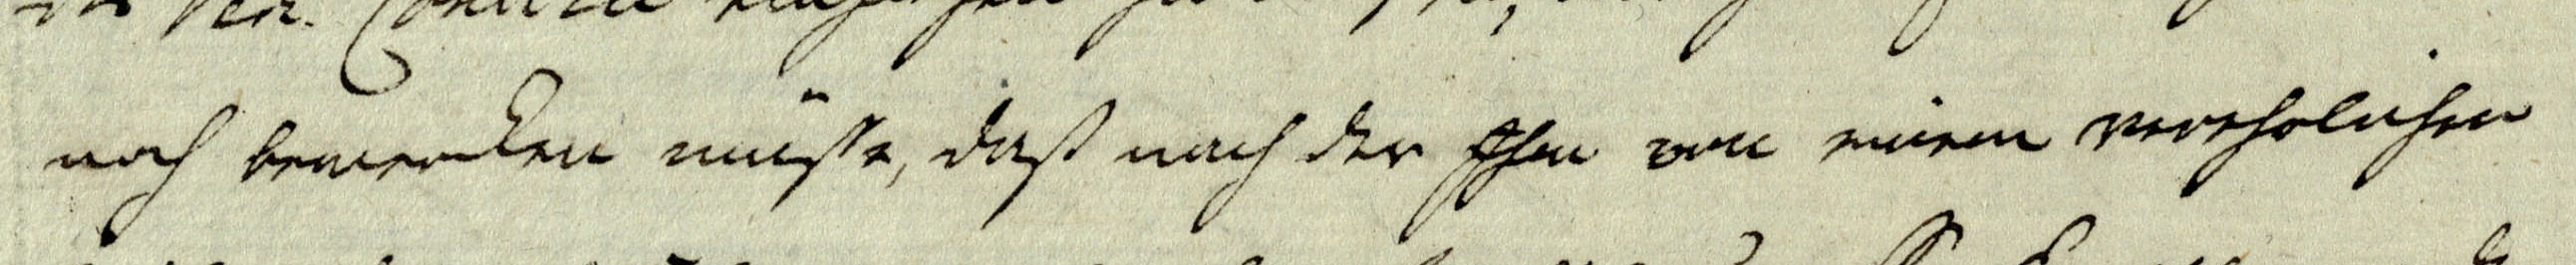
noch bemercken müsse, daß nach der Ihm von einem verehrlichen
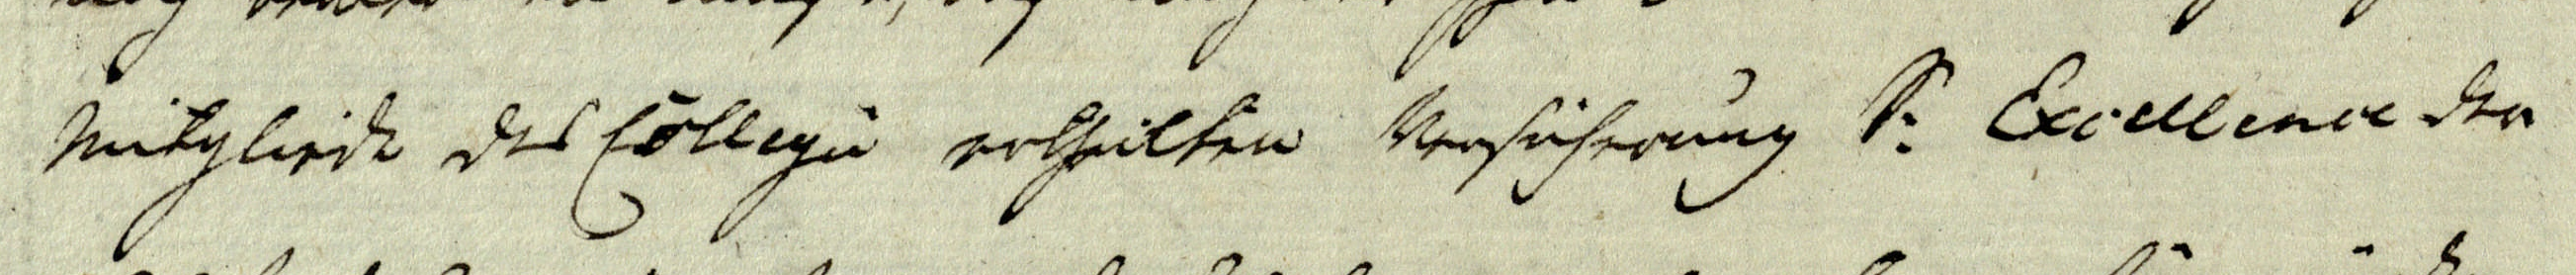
Mitgliede des Collegii ertheilten Versicherung Sr. Excellence der
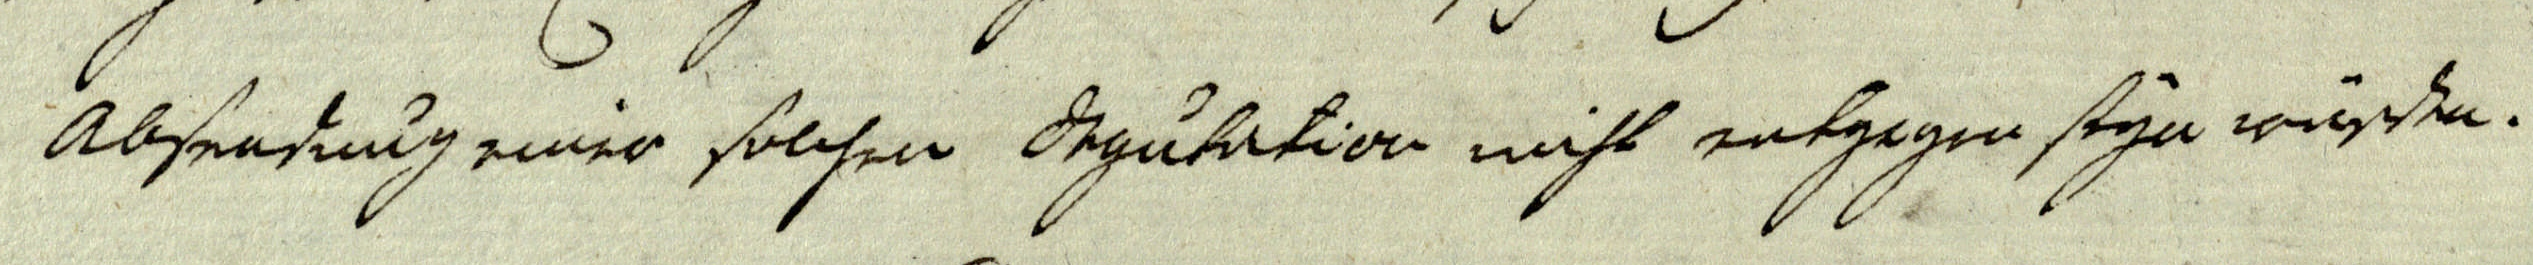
Absendung einer solchen Deputation nicht entgegen seÿn würden.
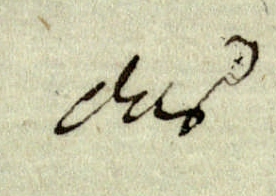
das
